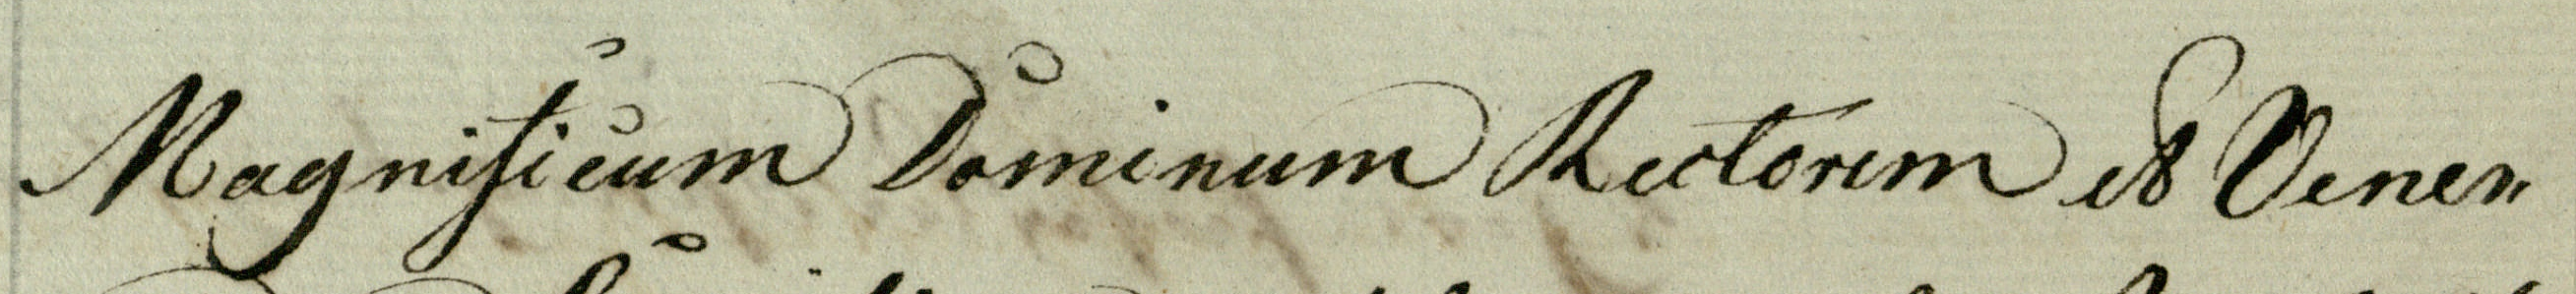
Magnificum Dominum Rectorem et Vene¬
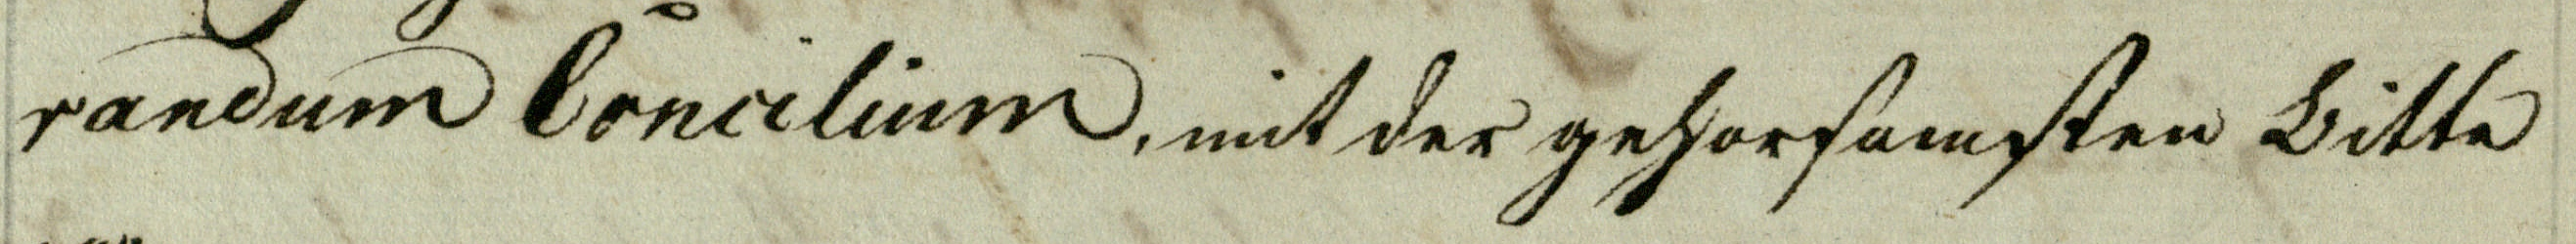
randum Concilium, mit der gehorsamsten Bitte
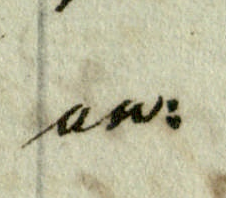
an:
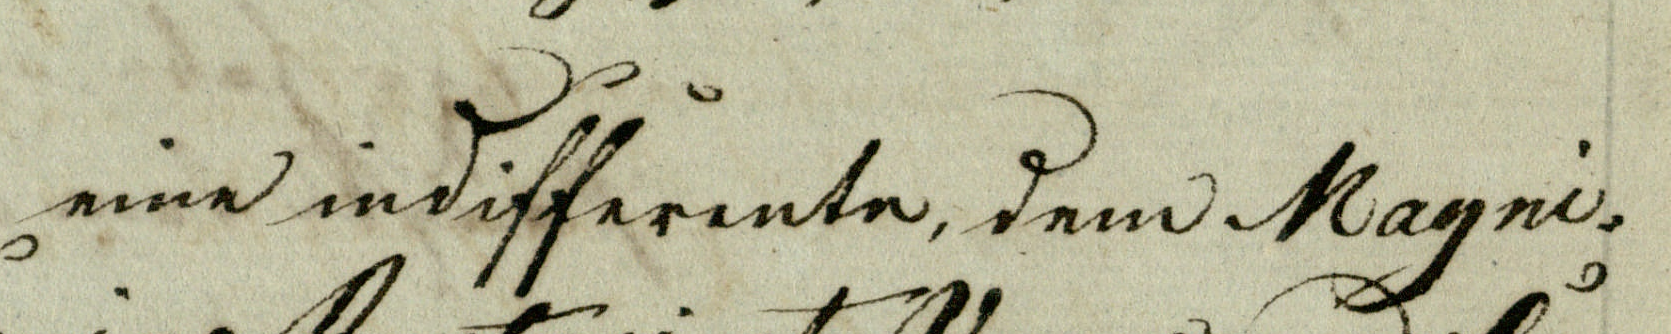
eine indifferente, dem Magni¬
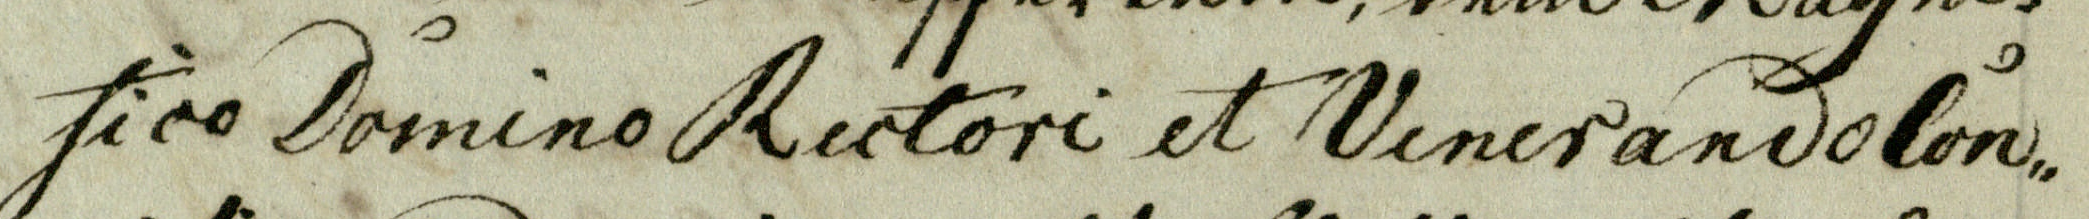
fico Domino Rectori et Venerado Con¬
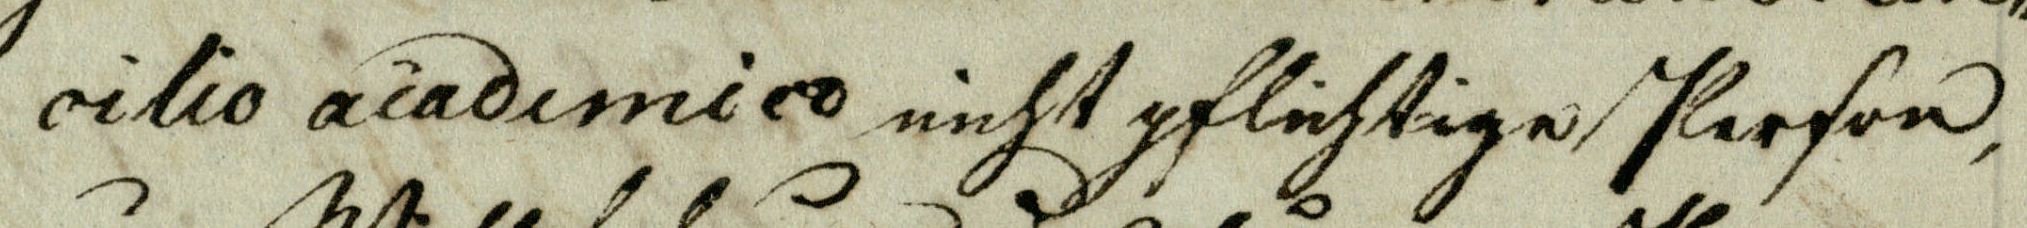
cilio academico nicht pflichtige Person,
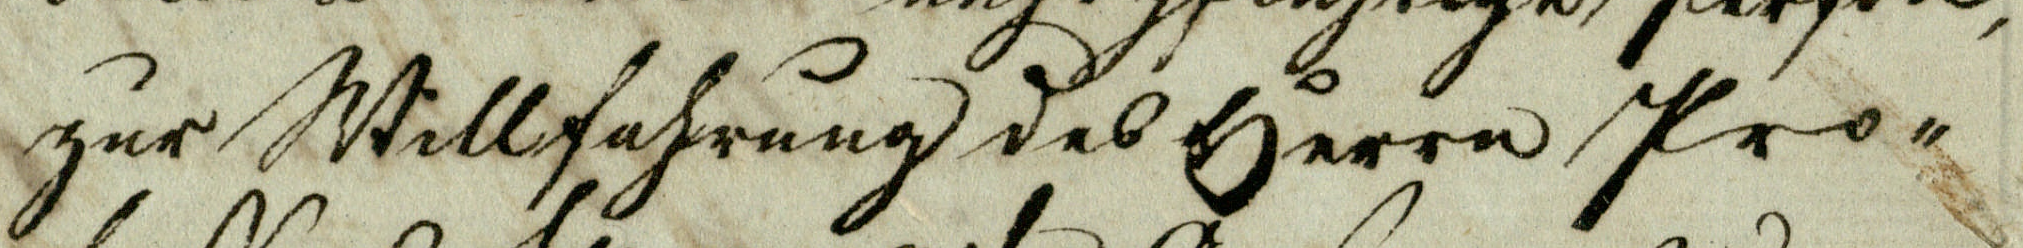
zur Willfahrung des Herrn Pro¬
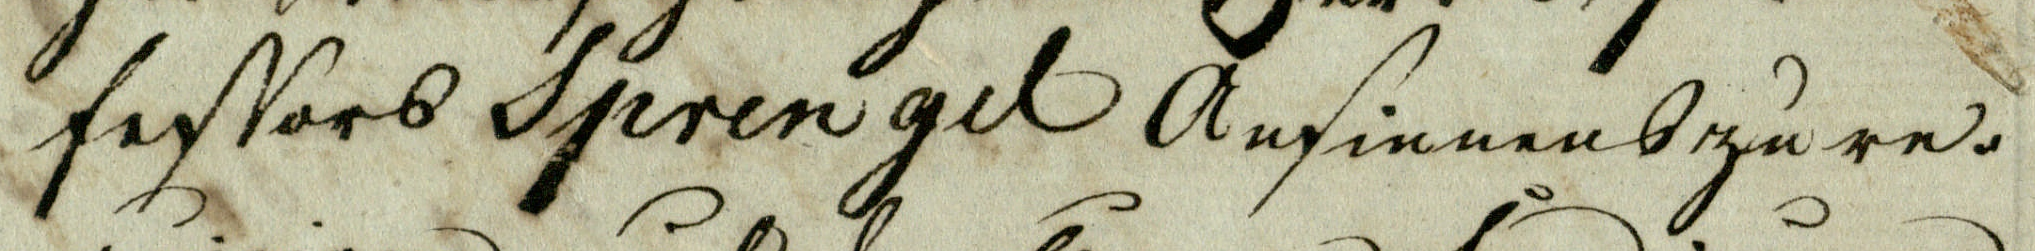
fessors Sprengel Ansinnens zu re¬
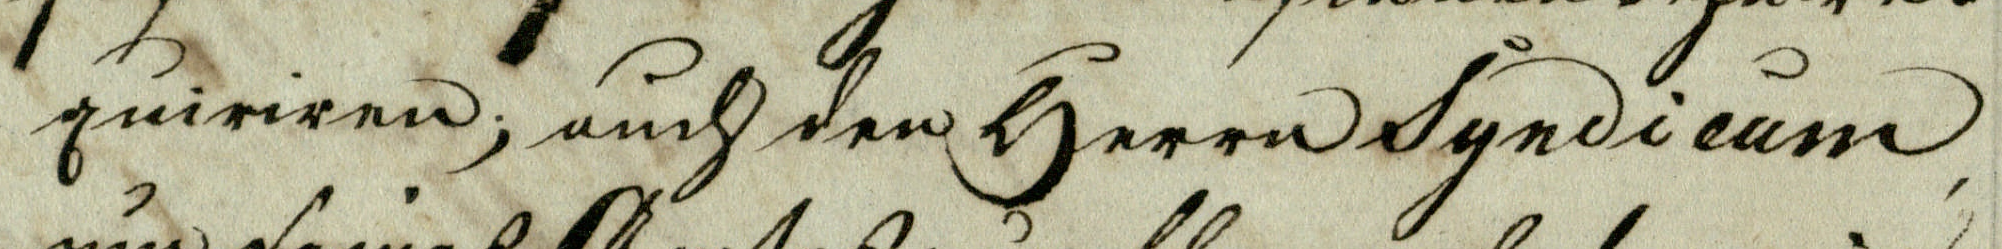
quiriren; auch den Herrn Syndicum
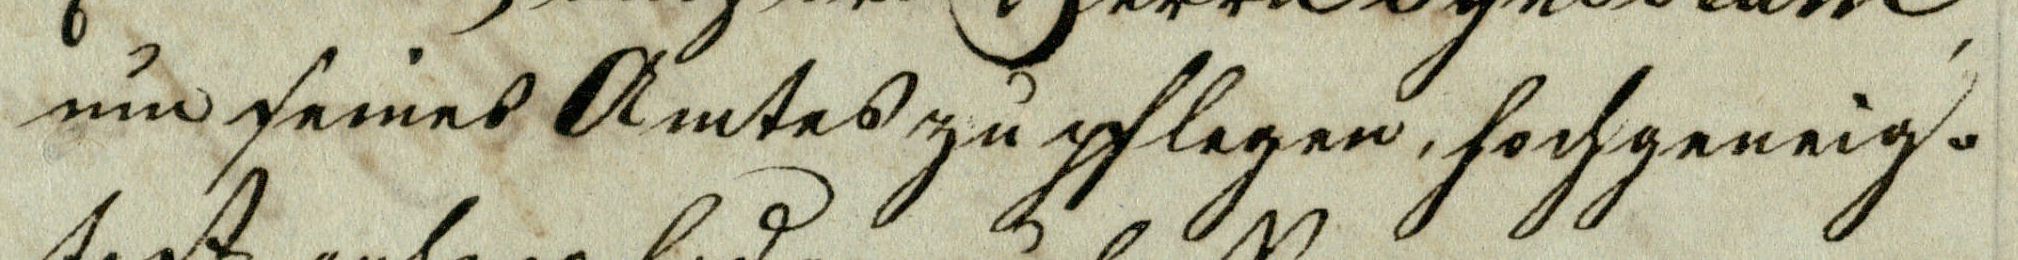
um seines Amtes zu pflegen, hochgeneig¬
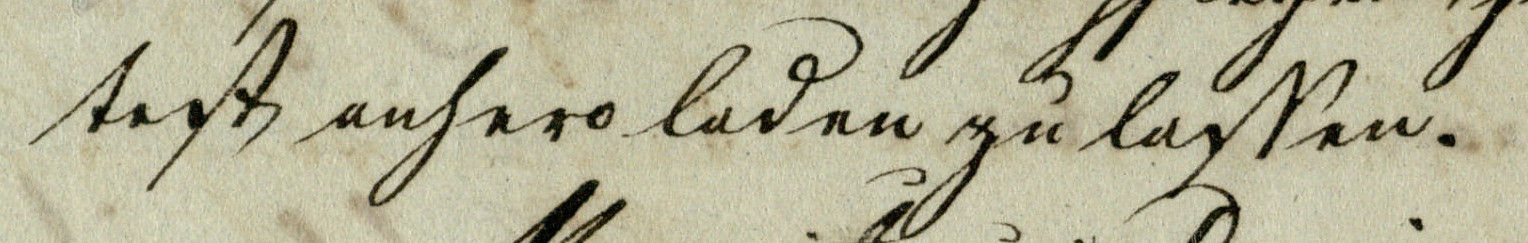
test anhero laden zu lassen.
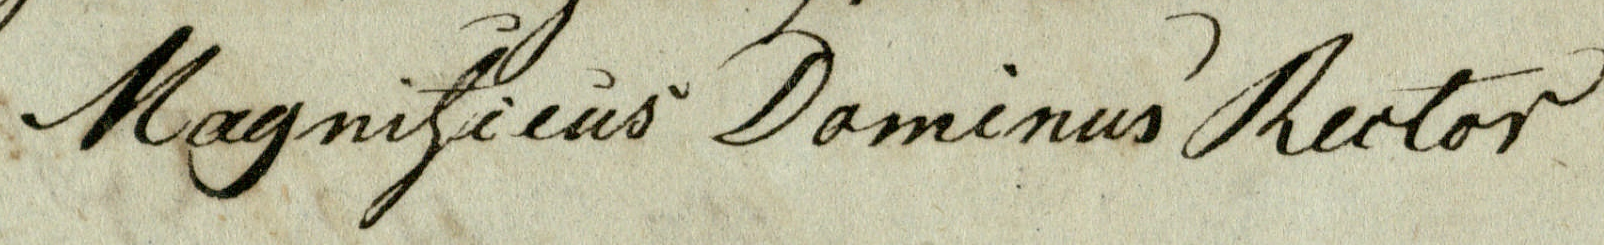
Magnificius Dominus Rector
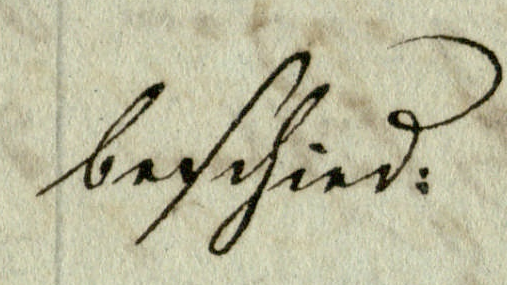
beschied:
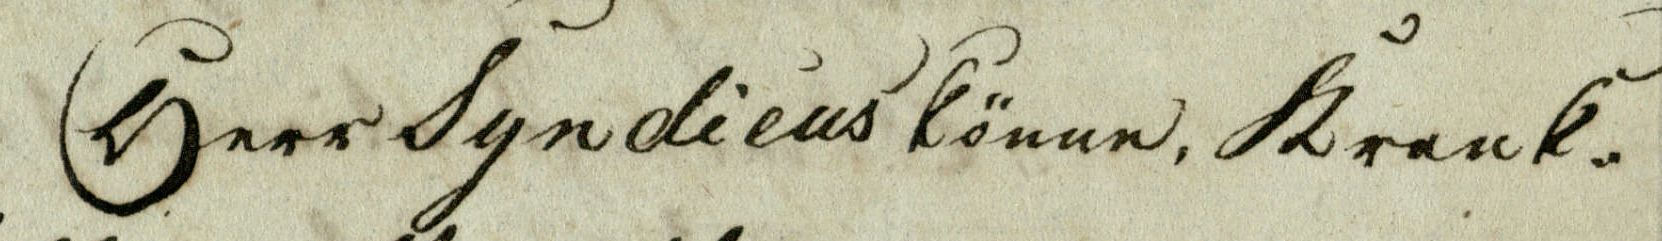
Herr Syndicus könne, Krank¬
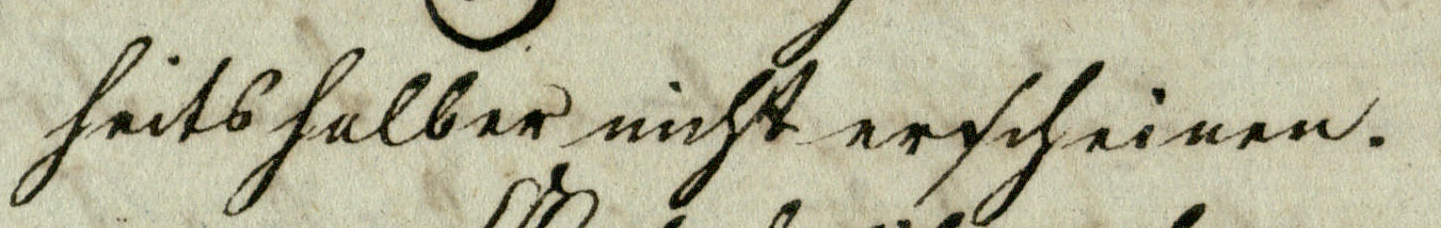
heits halber nicht erscheinen.
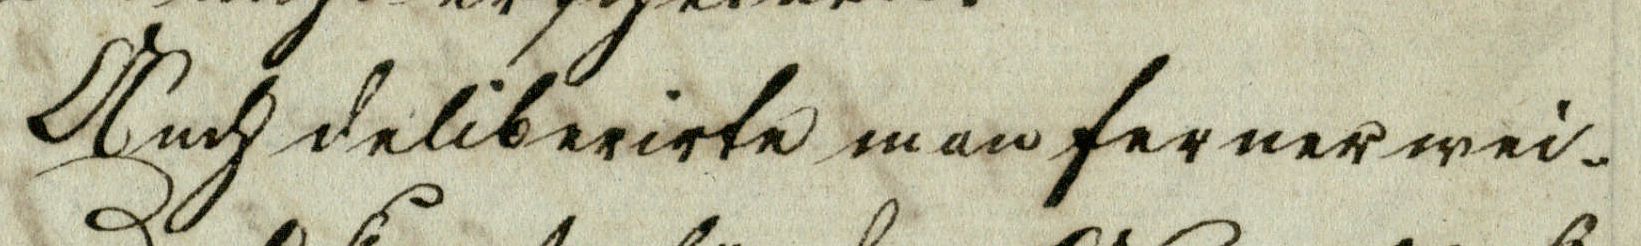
Auch deliberirte man ferner wei¬
